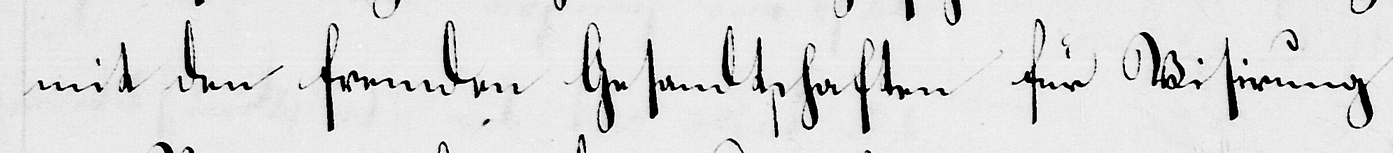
mit den fremden Gesandtschaften für Visirung
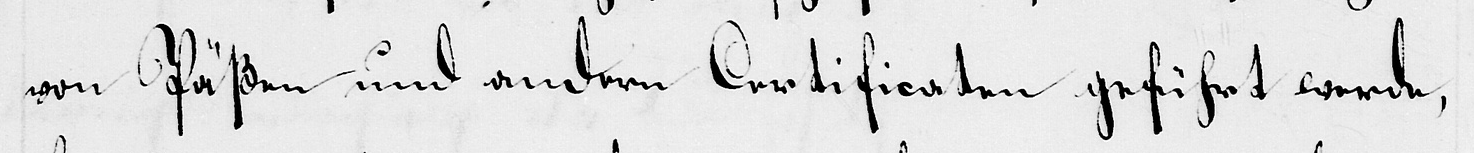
von Päßen und andern Certificaten geführt werde,
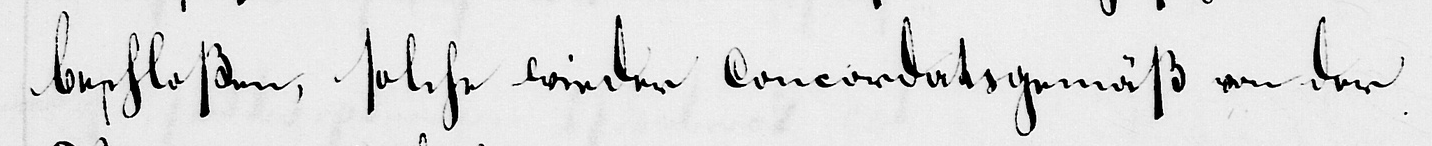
beschloßen, solche wieder concordatsgemäß von der
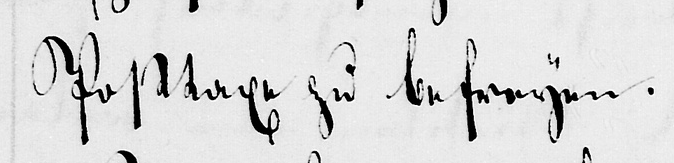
Posttaxe zu befreyen.
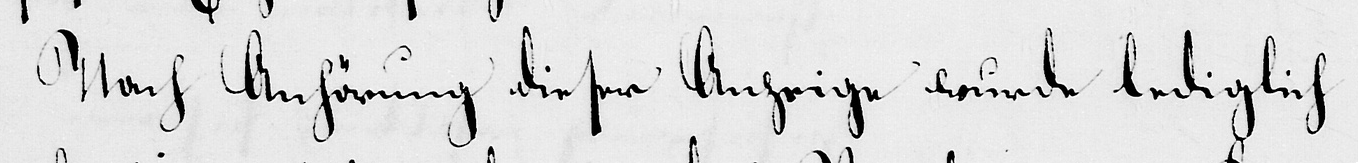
Nach Anhörung dieser Anzeige wurde lediglich
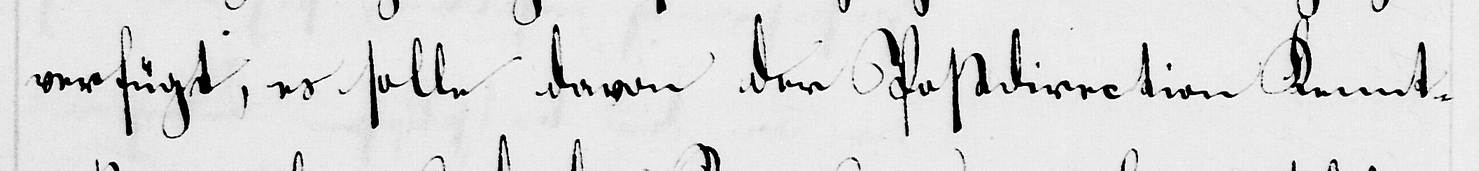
verfügt, es solle davon der Postdirection Kennt¬
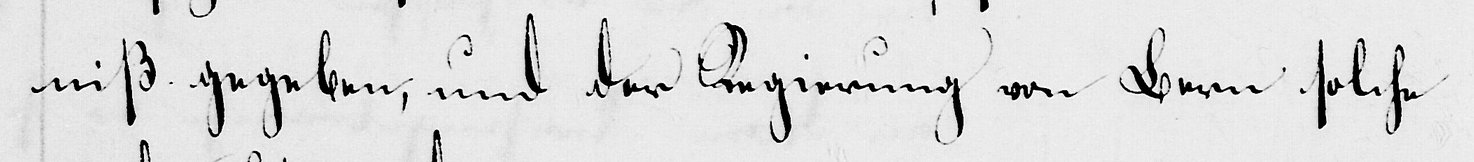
niß gegeben, und der Regierung von Bern solche
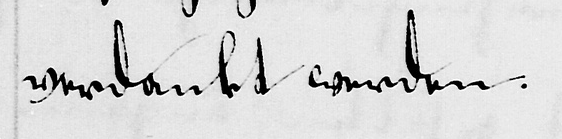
verdankt werden.
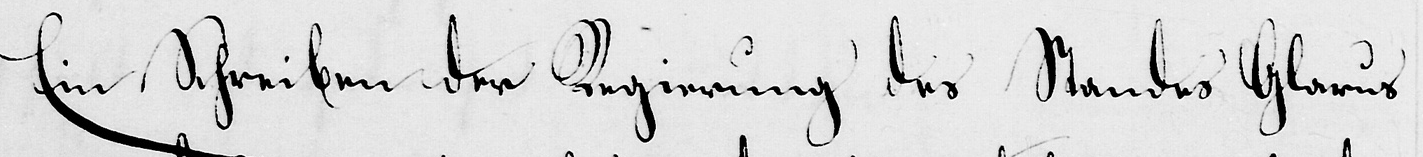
Ein Schreiben der Regierung des Standes Glarus
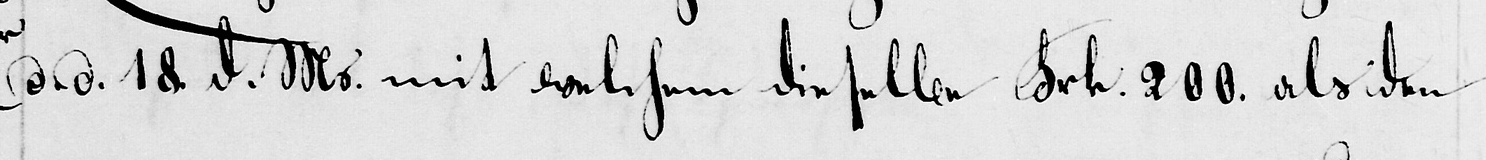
d. d. 18. d. Ms. mit welchen dieselbe Frk. 200. als den
